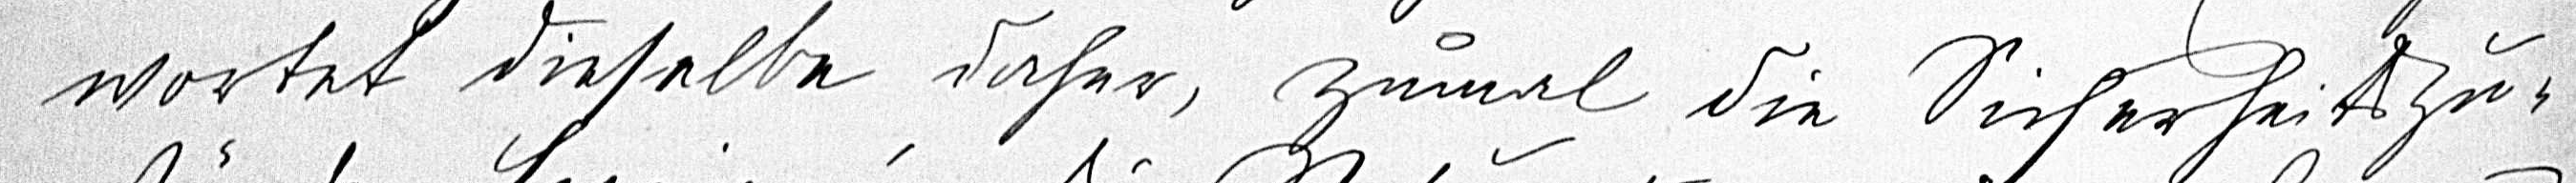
wortet dieselbe daher, zumal die Sicherheitszu¬
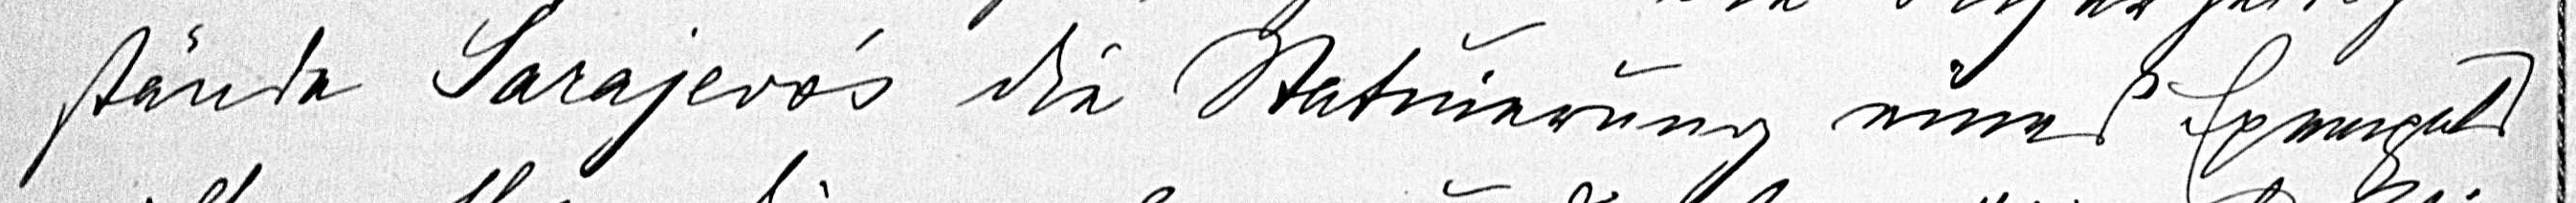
stände Sarajevo’s die Statuierung eines Exempels
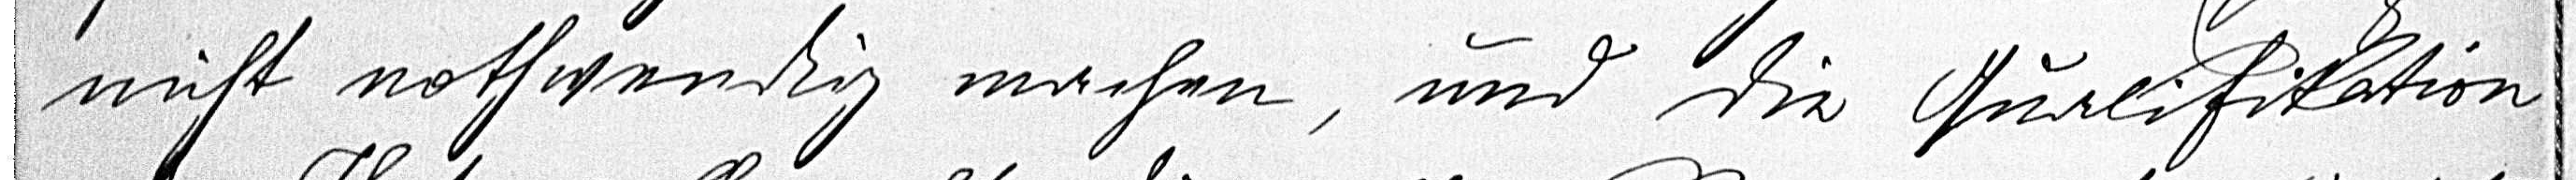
nicht nothwendig machen, und die Qualifikation
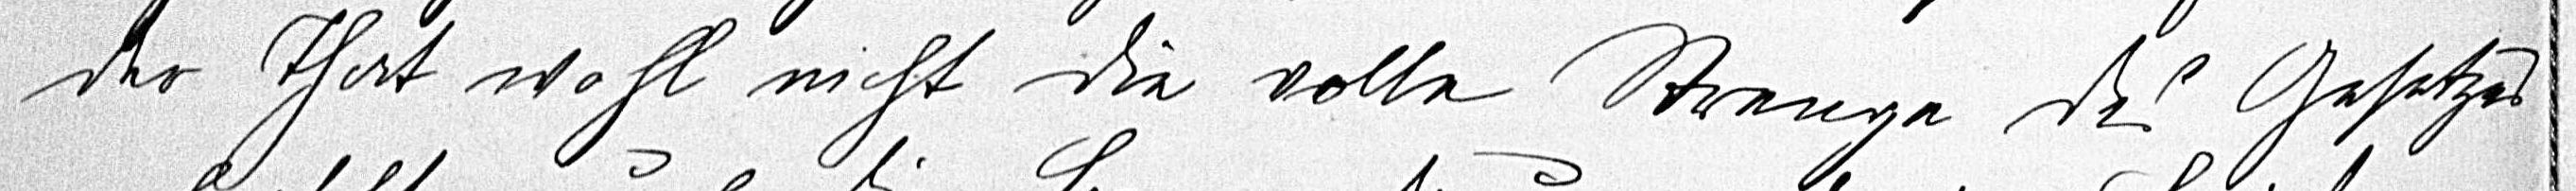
der That wohl nicht die volle Strenge des Gesetzes
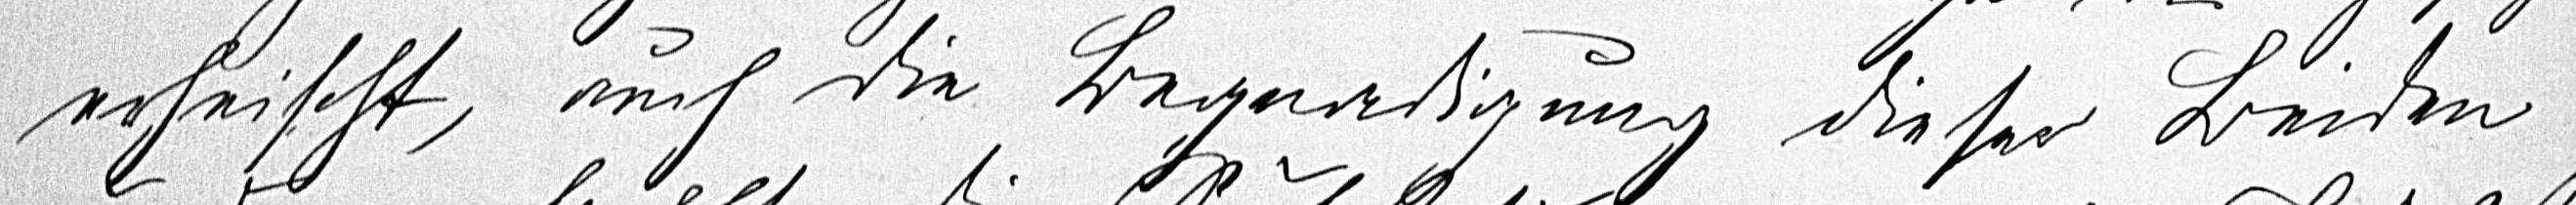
erheischt, auch die Begnadigung dieser Beiden
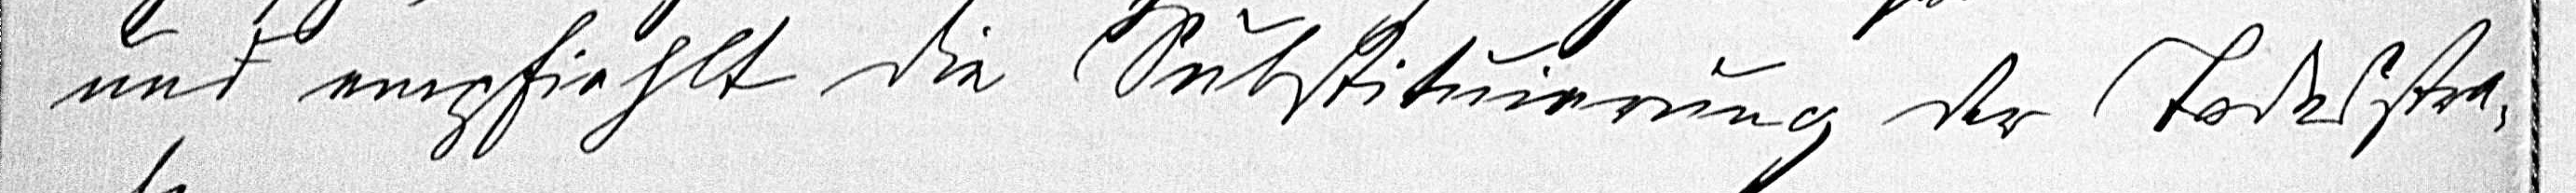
und empfiehlt die Substituirung der Todesstra¬
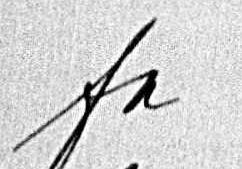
fe:
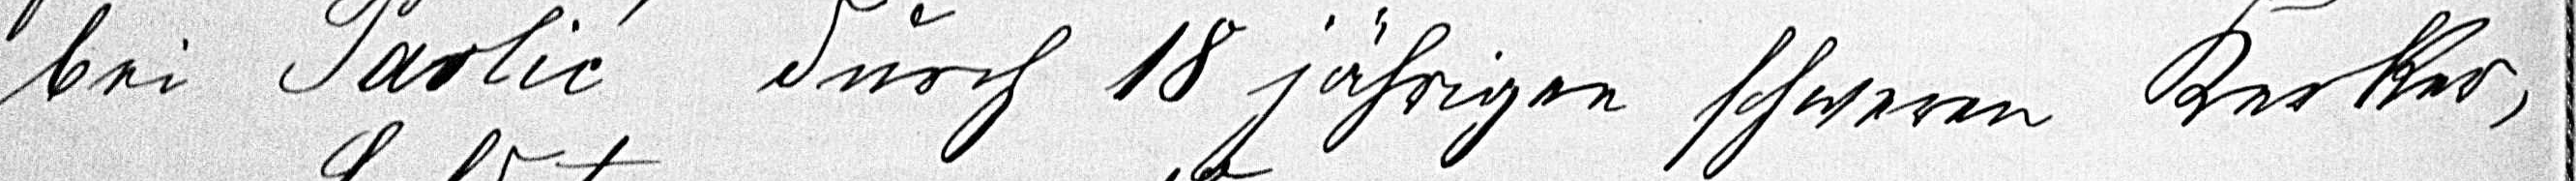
bei Pavlić durch 18jährigen schweren Kerker,
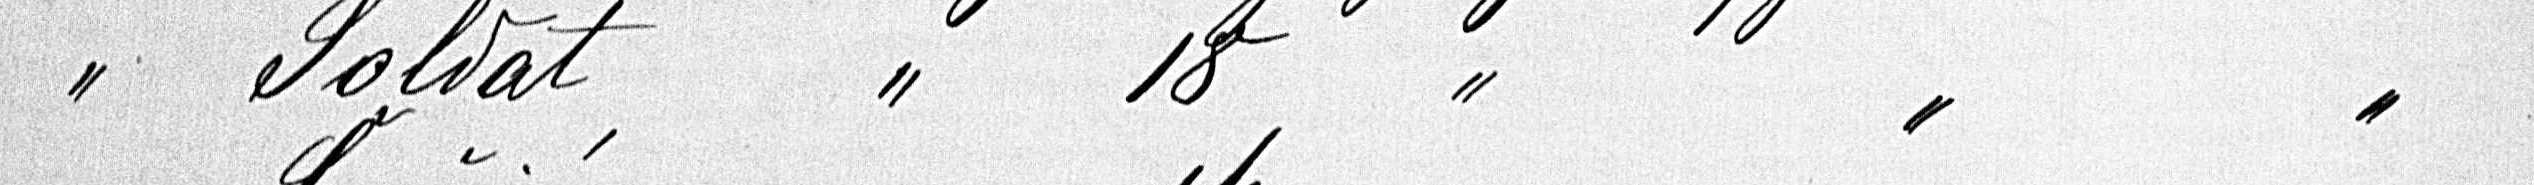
„ Soldat „ 18 „ „ „
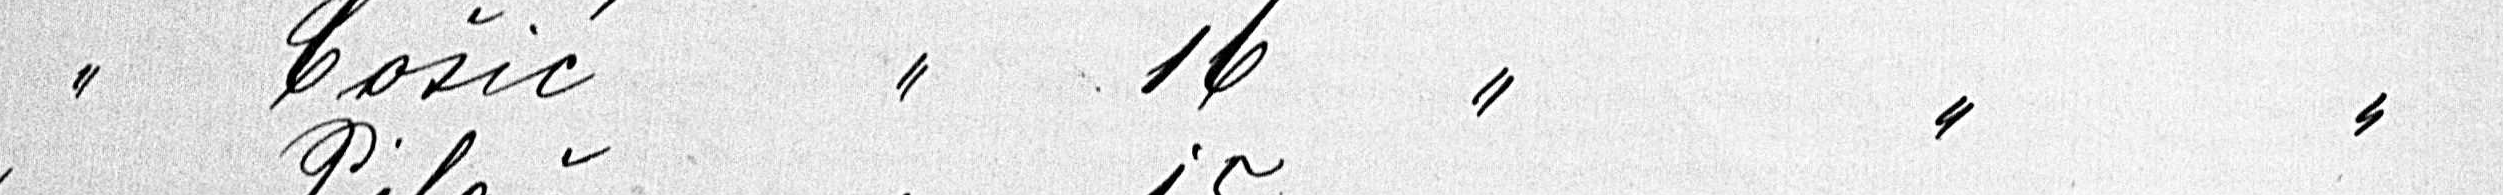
„ Čošić „ 16 „ „ „
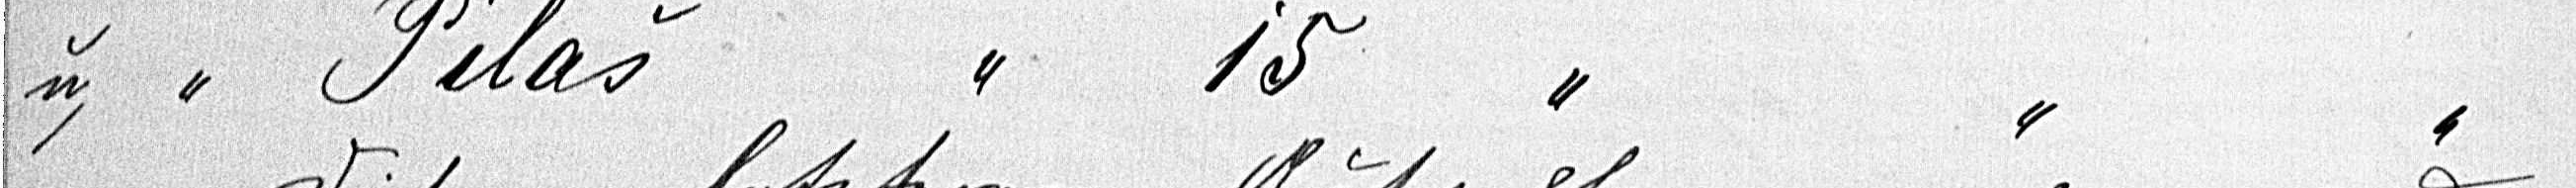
u. „ Pilaš „ 15 „ „ „
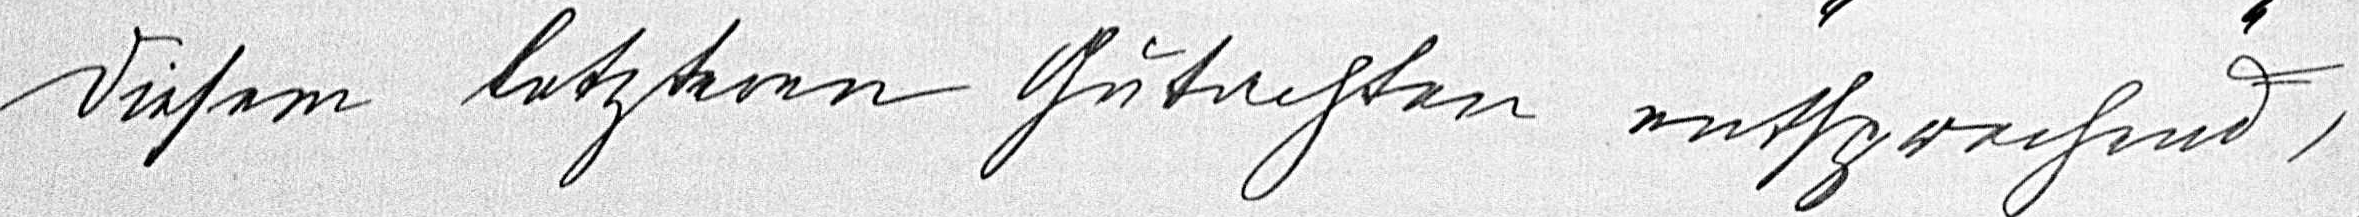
Diesem letzteren Gutachten entsprechend
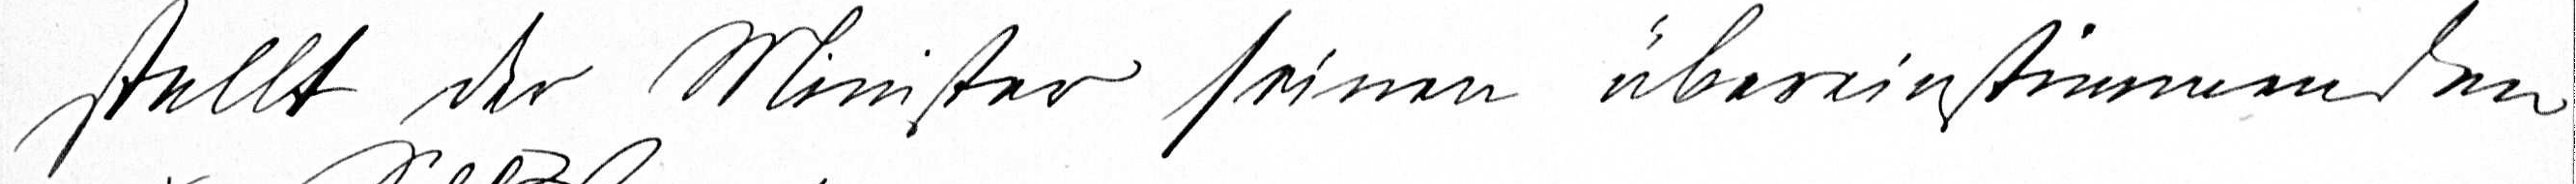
stellt der Minister seinen übereinstimmenden
